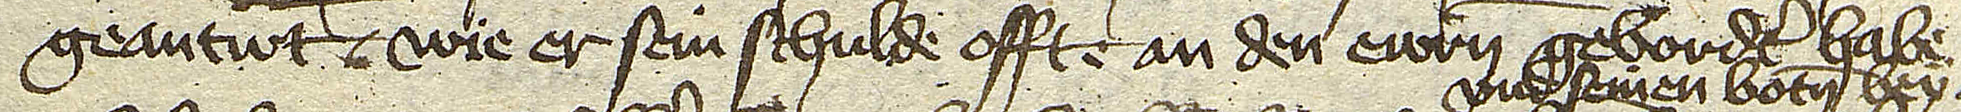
geantw*t / wie er ſein ſchulde offte an den ewrn* gevordt* habe
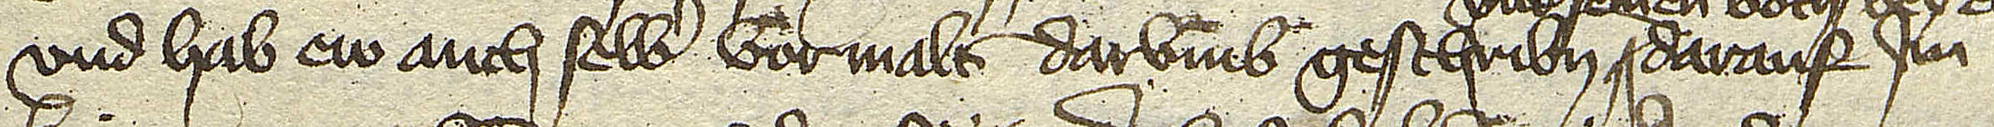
vnd hab ew auch ſelb* vormals darvmb geſchribn* darauf Im
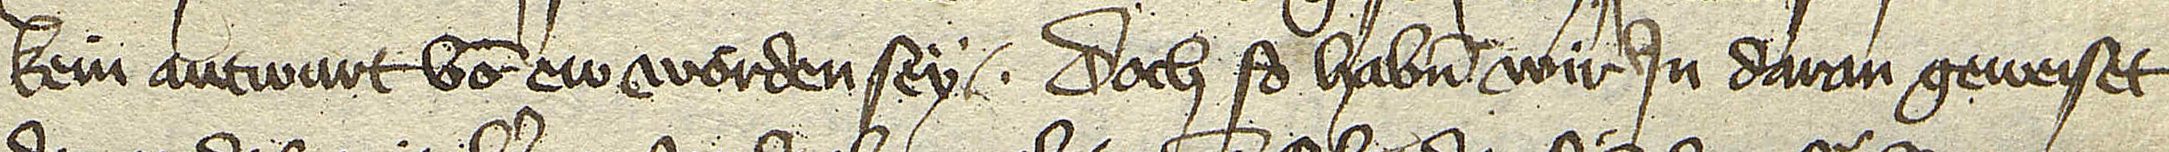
kein antwurt vo* ew worden ſey / . Doch ſo habn* wir In daran geweiſet
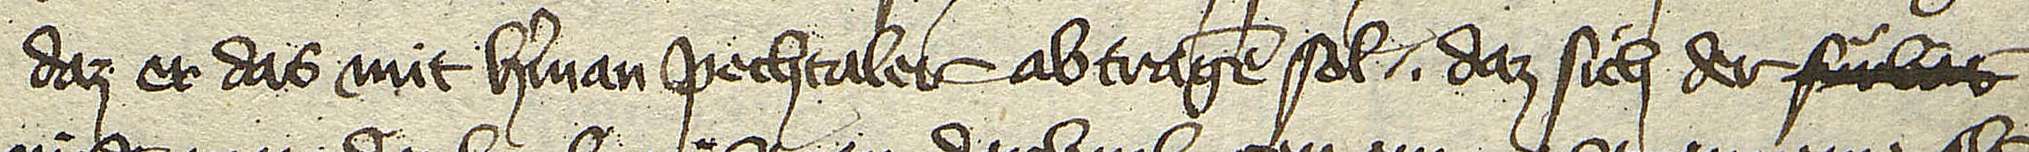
daʒ er das mit h*man pechtaler abtrage* ſol / . daʒ ſich der fürbas
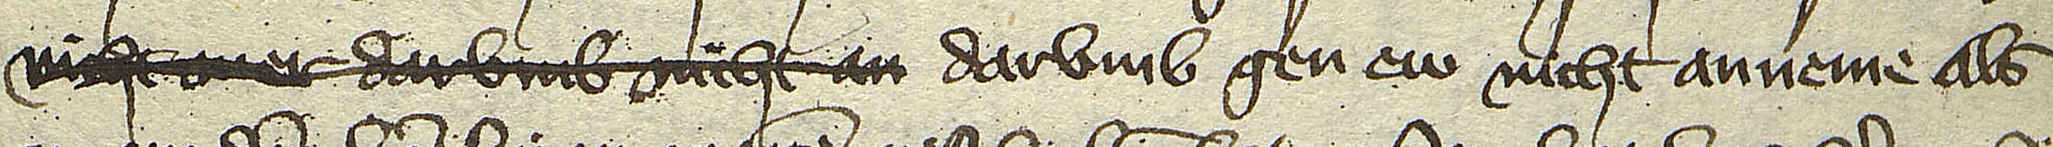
nicht mer darvmb nicht an darvmb gen ew nicht anneme als
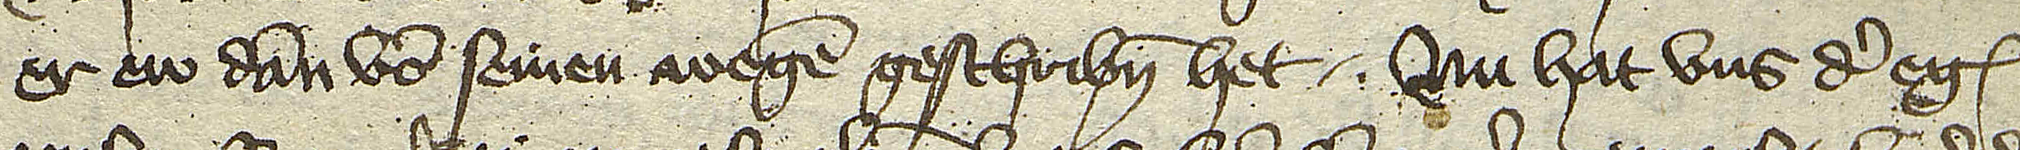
er ew dan* vo* ſeinen wege* geſchribn* het / . Nu hat vns d* eg*
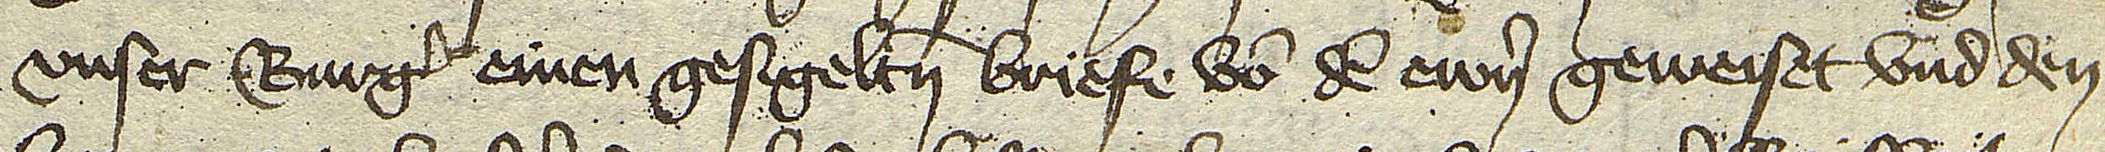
vnſer Burg* einen geſigeltn* briefe vo* d* ewn* geweiſet vnd den
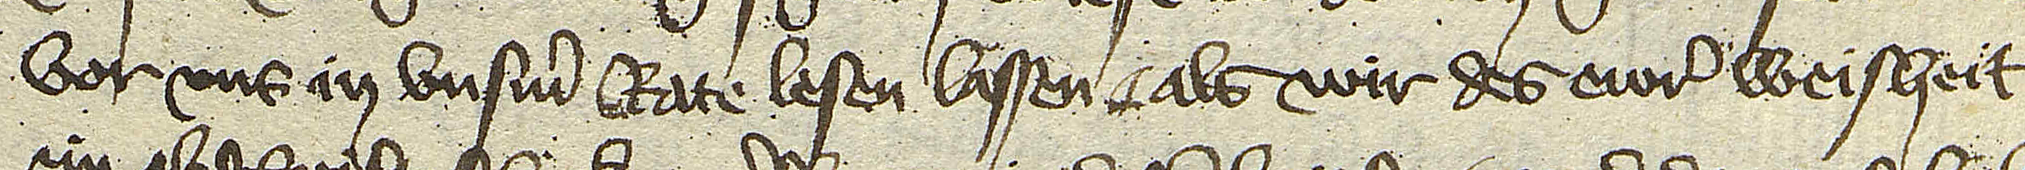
vor vns in vnſm* Rate leſen laſſen / als wir des ewr* weiſheit
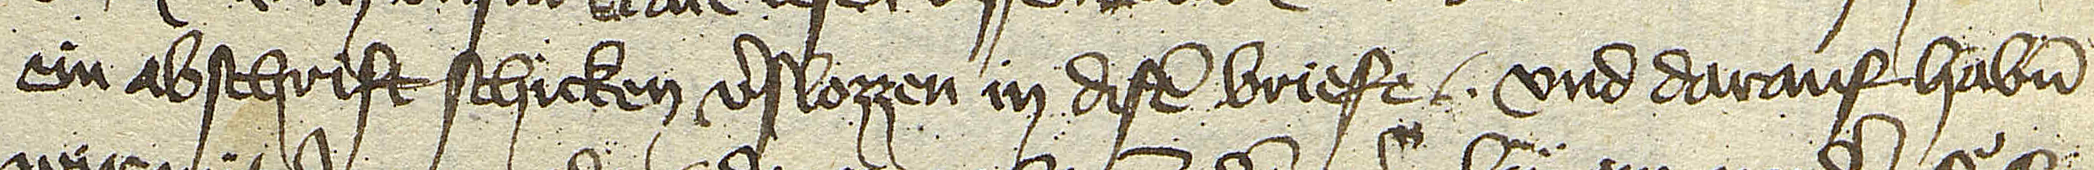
ein abſchrift ſchicken v*ſloʒʒen in diſe* briefe / . vnd darauf habn*
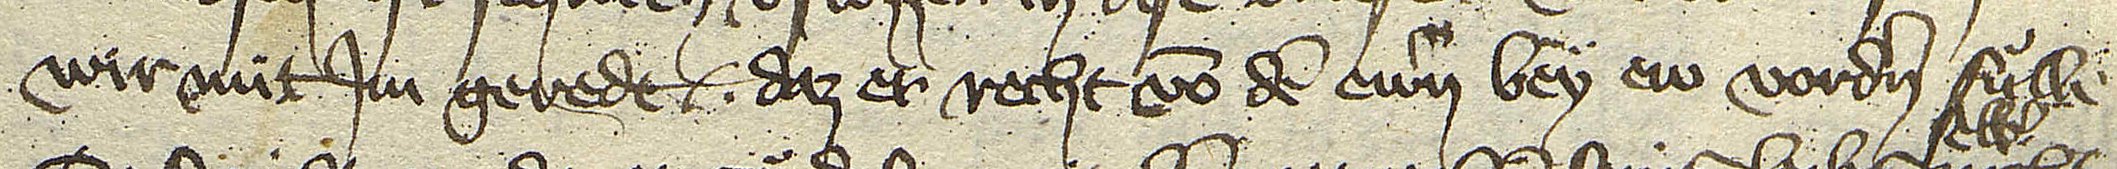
wir mit Im geredt / . daʒ er recht vo* d* ewn* bey ew vordn* ſülle
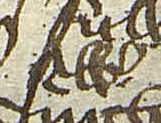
ſelb*
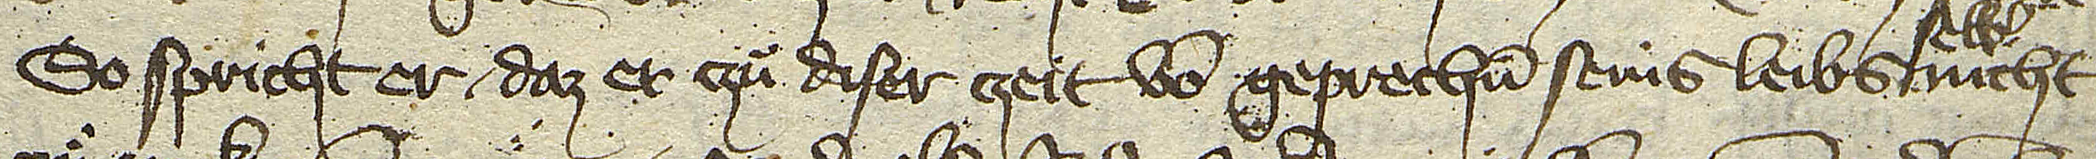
So ſpricht er / daʒ er cʒü diſer cʒeit vo* geprechn* ſeins leibs nicht
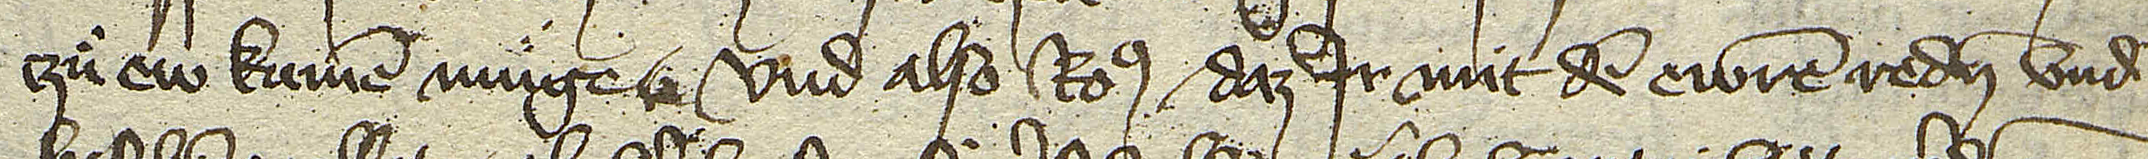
cʒü ew kume* müge / vnd alſo Ro* / daʒ Ir mit d* ewre* redn* vnd
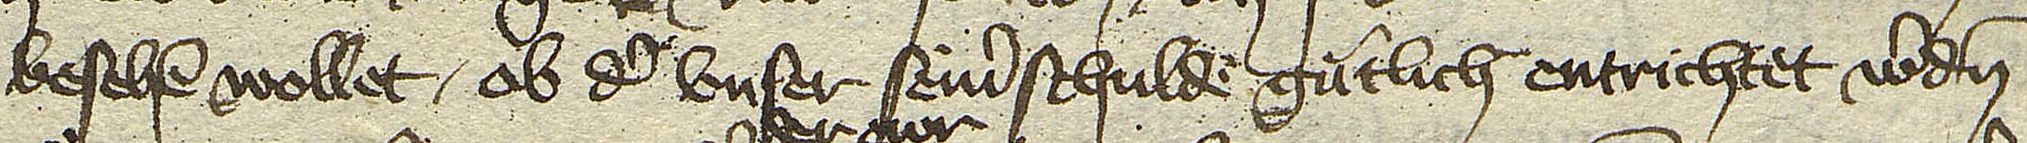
beſehe* wollet / ob d* vnſer ſein* ſchulde gütlich entrichtet w*dn*
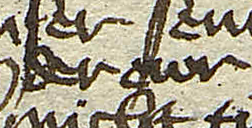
der ewr
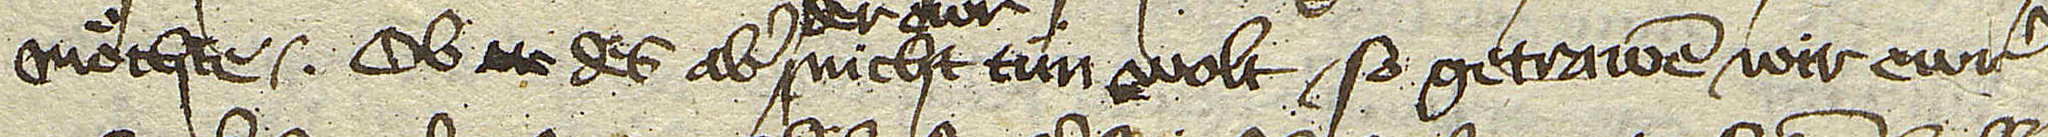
möchte / . Ob er des ab* nicht tün wolt / ſo getrawe* wir ewr*
